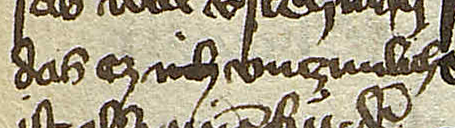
das eʒ nih vncʒimlich
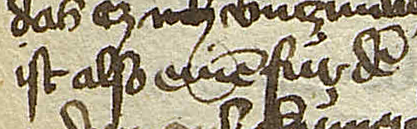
iſt alſo eine* für de*
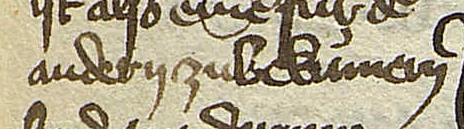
andern cʒubekümern
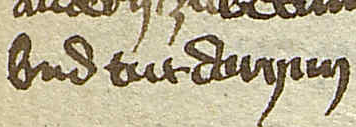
vnd tut darynn
